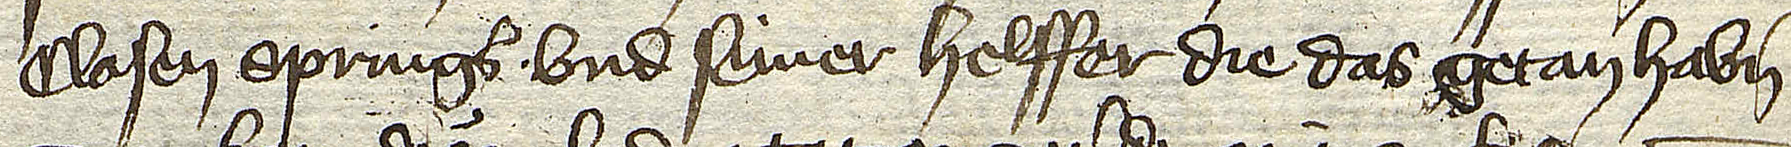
Claſen Springs* vnd ſeiner helffer die das getan habn*
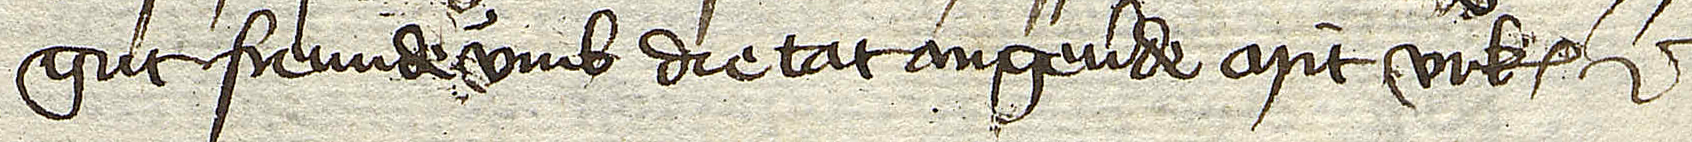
gut freunde v̈mb die tat ongeu*de Mit vrk* ec*
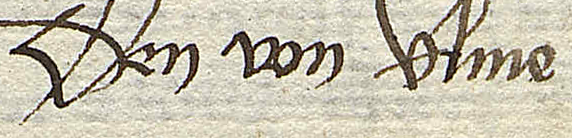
Den von Vlme
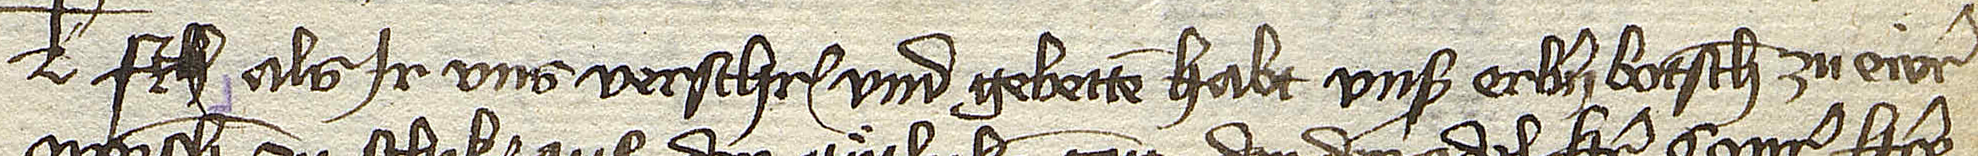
L*frh als Ir vns verſchr* vnd gebette* habt vnſ* erbn* botſch* ʒu ewr*
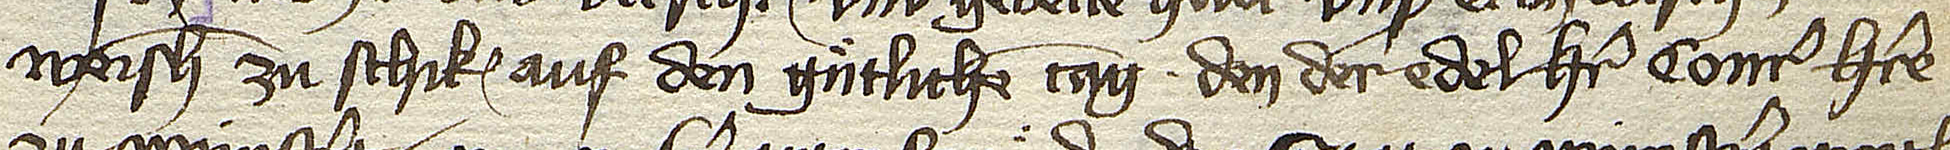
weiſh* ʒu ſchik* auf den gütliche* tag . den der edel hr* Conr* hr*e
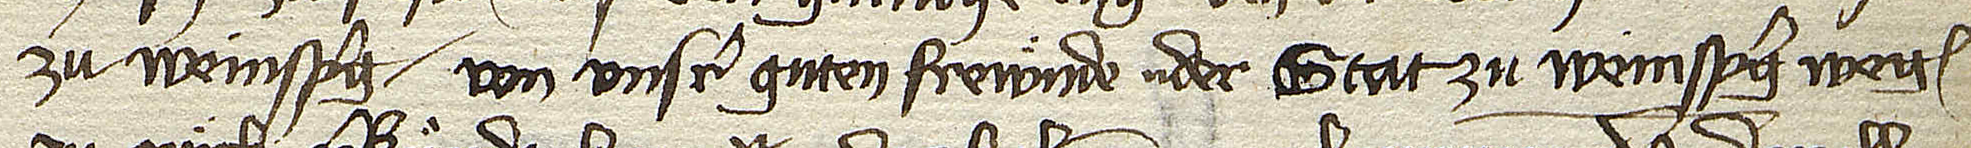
ʒu weinſp*g / von vnſr* guten freẅnde ~ der Stat ʒu weinſpg* weg*
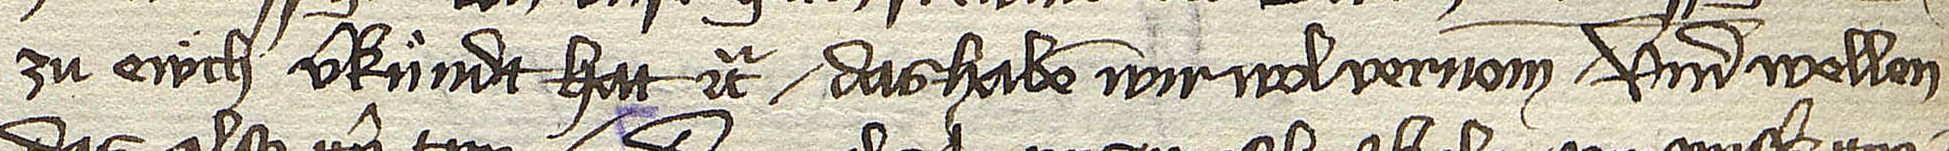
ʒu eẅch v*kündt hat ec* / das habe* wir wol vernom* / Vnd wellen
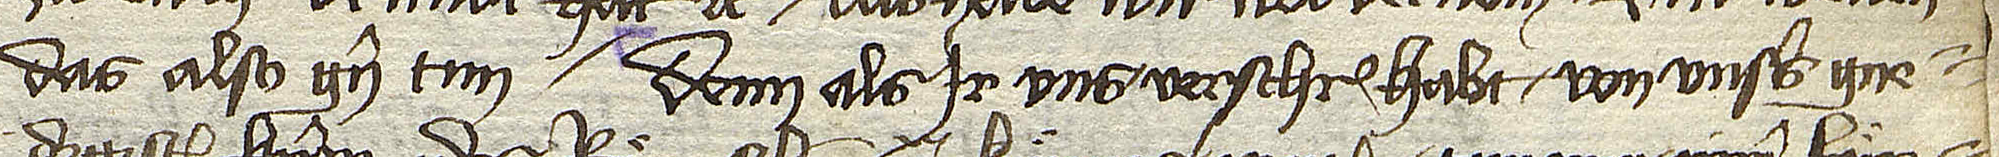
das alſo gn* tun / Denn als Ir vns verſchr* habt / von vnſs* gne =
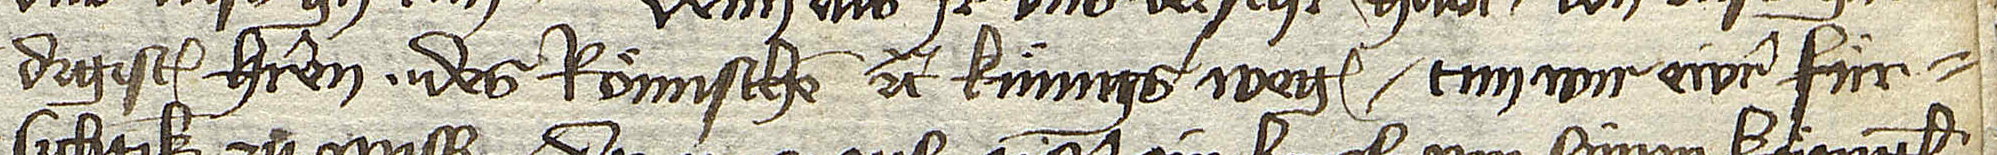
digiſt* hr*en ~ des Römiſche* ec* künigs weg* / tun wir ewr* für =
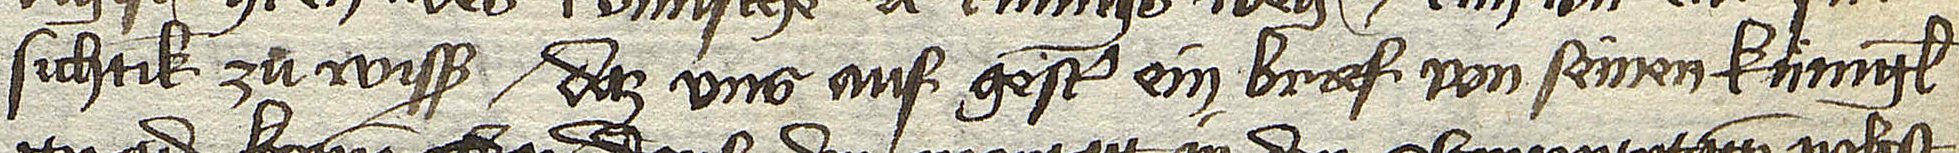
ſichtik* ʒu wiſſ* / daʒ vns auf geſt* ein brief von ſeinen künigl*
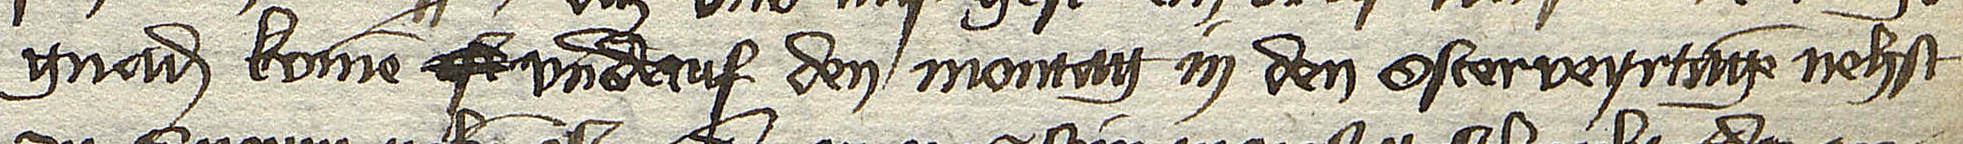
gnad* kome* iſt vnd auf den montag in den Oſterveyrtage* nehſt
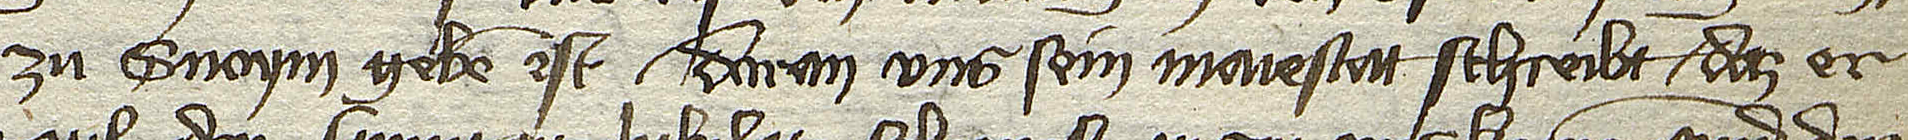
ʒu Snoym gebe* iſt / daran vns ſein maieſtat ſchreibt / daʒ er
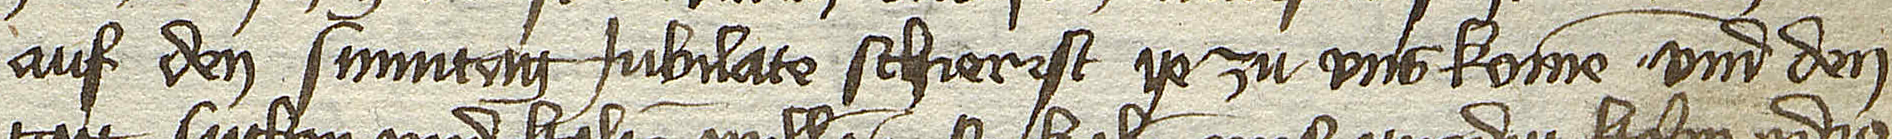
auf den ſunntag Iubilate ſchieriſt ye ʒu vns kome* / vnd den
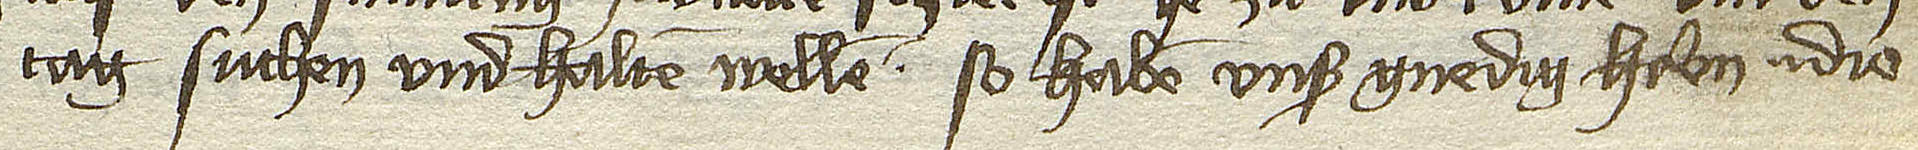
tag ſuchen vnd halte* welle* . ſo habe* vnſ* gnedig hr*en ~ die
